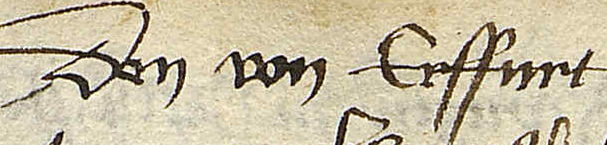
Den von Erffurt
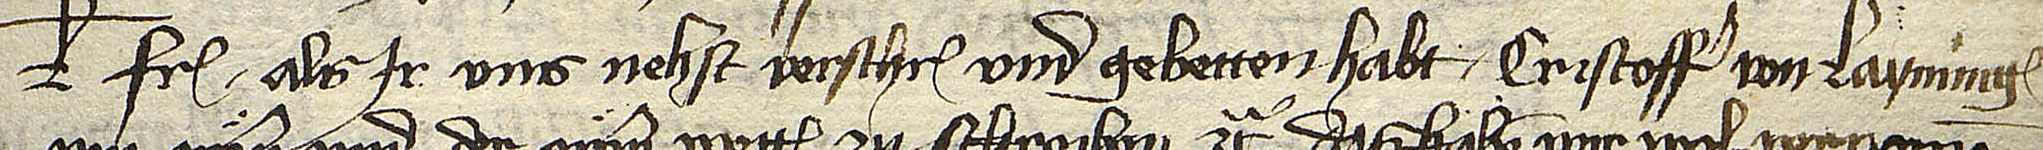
L* fr* / als Ir vns nehſt verſchr* vnd gebetten habt / Criſtoff* von Layming*
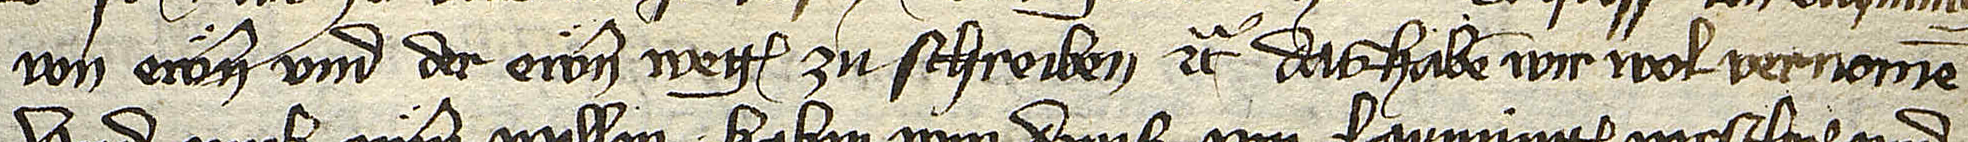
von eẅ*n vnd der eẅ*n weg* ʒu ſchreiben ec* das habe* wir wol vernome*
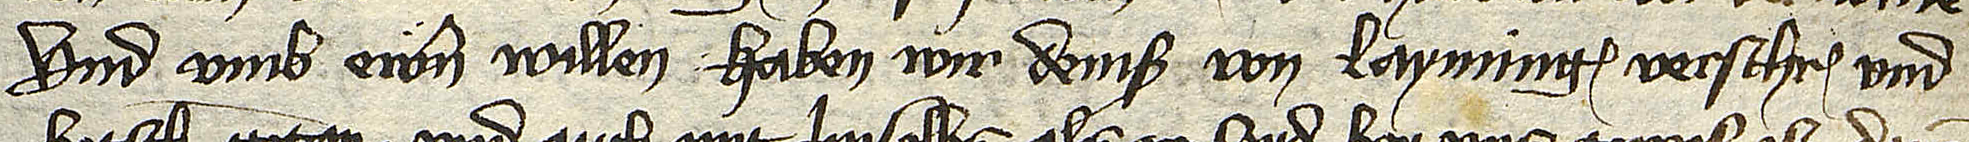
Vnd vmb eẅ*n willen : haben wir demſ* von layming* verſchr* vnd
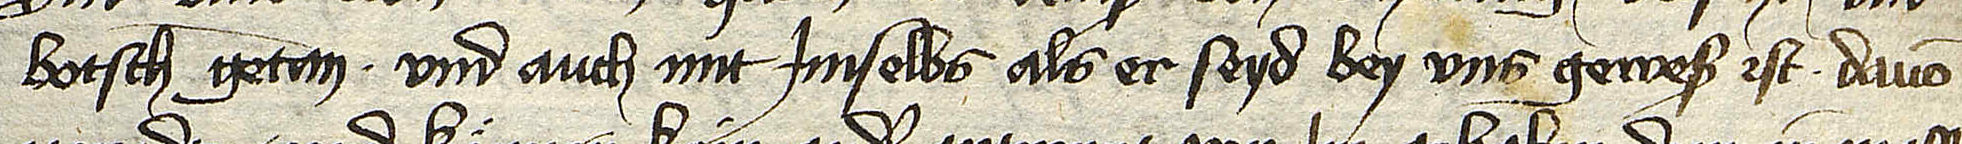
botſch* getan . vnd auch mit Imſelb als er ſeyd bey vns geweſ* iſt . dauo*
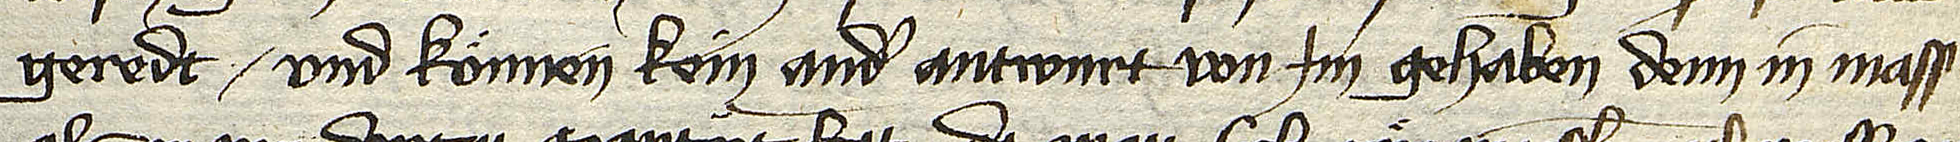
geredt / vnd können kein and* antwurt von Im gehaben denn in maſſ
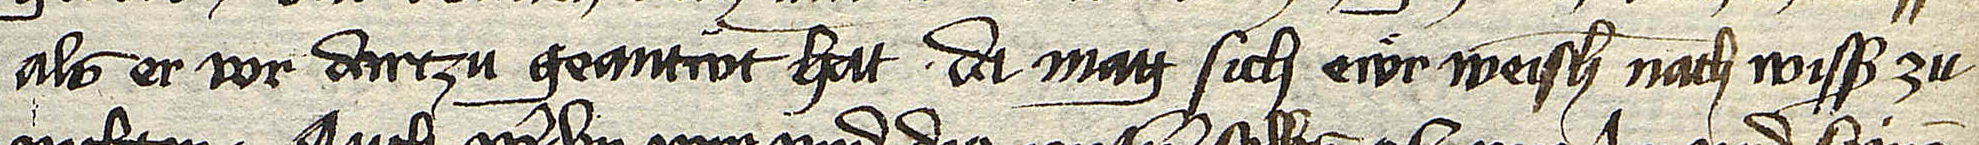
als er vor darcʒu geantw*t hat . da mag ſich eẅr weiſh* nach wiſſ* ʒu
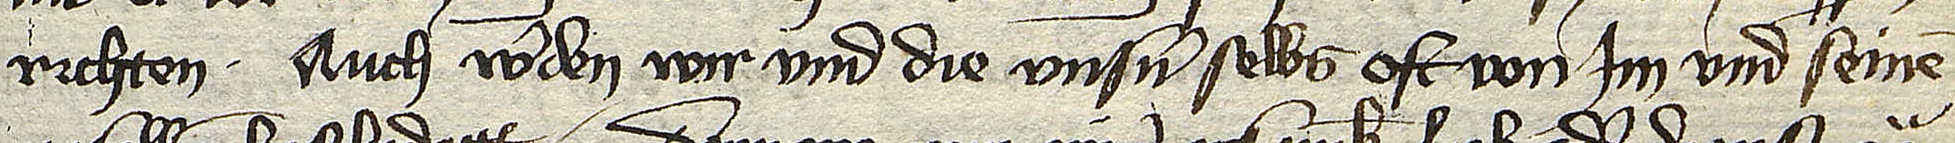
richten . Auch w*den wir vnd die vnſ*n ſelbs oft von Im vnd ſeine*
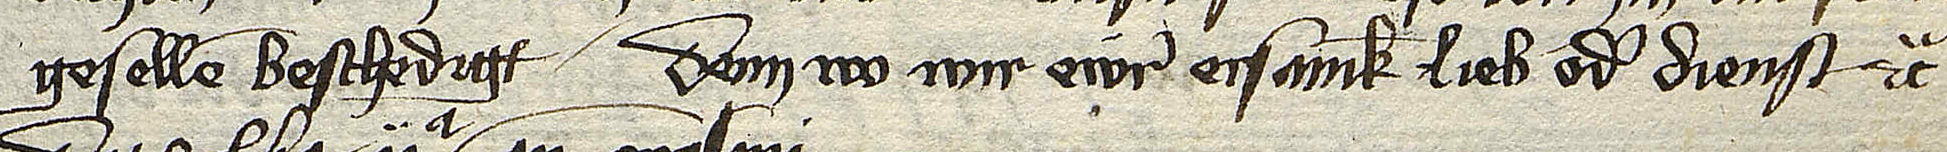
geſelle* beſchedigt / Denn wo wir eẅr* erſamk* lieb od* dienſt ec*
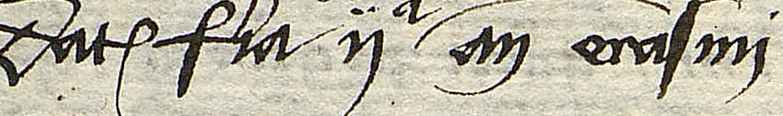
Dat* fia* ii* an* eraſmi
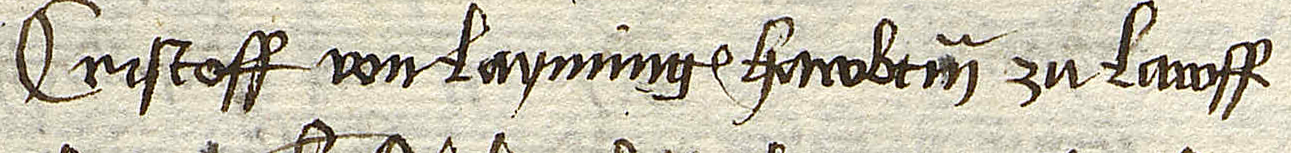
Criſtoff von Layming* hawbtm* ʒu Lawff
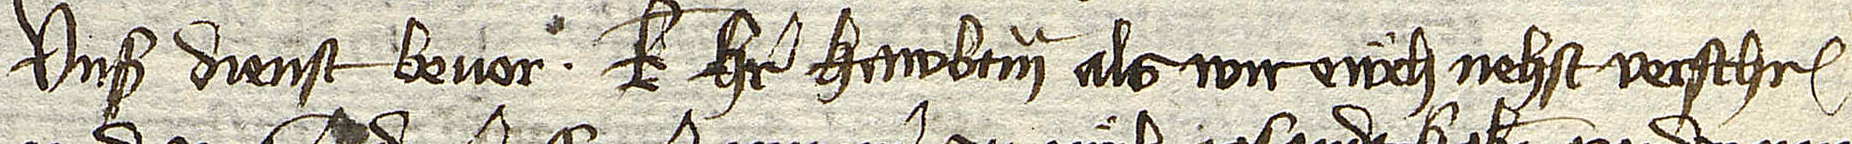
Vnſ* dienſt beuor . L* h*r hawbtm* als wir eẅch nehſt verſchr*
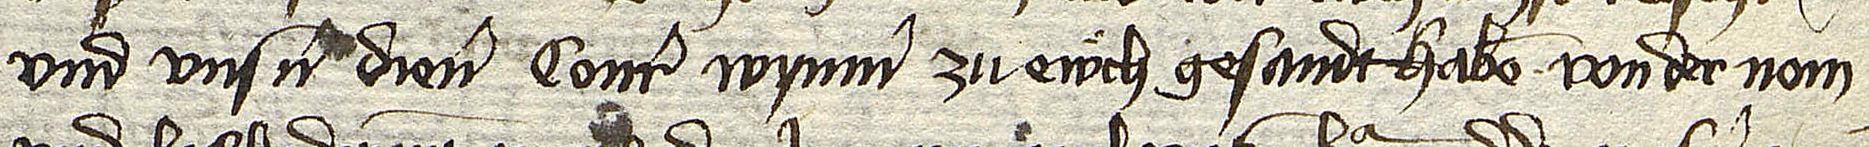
vnd vnſ*n dien* Conr* wynm* ʒu eẅch geſandt habe* . von der nom
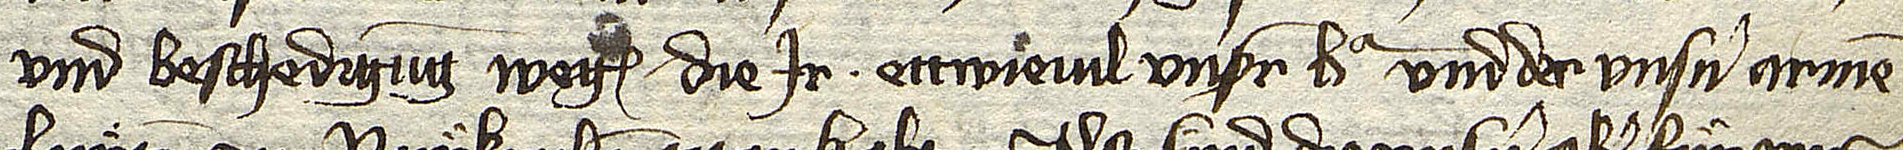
vnd beſchedigug* weg* / die Ir . ettwieuil vnſ*r b* vnd der vnſ*n arme*
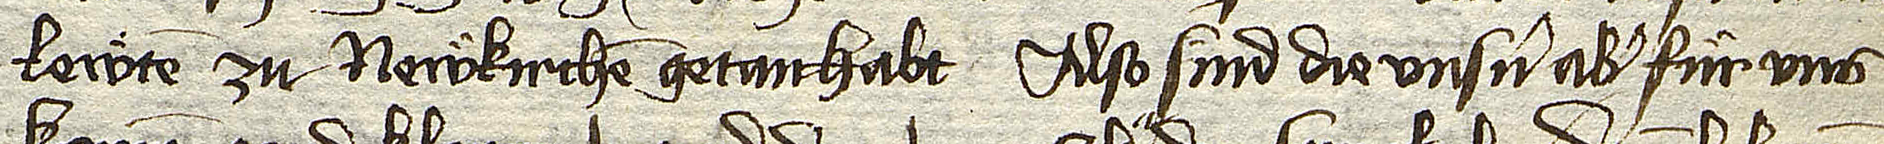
leẅte* ʒu Neẅkirche* getan habt Alſo ſind die vnſ*n ab* für vns
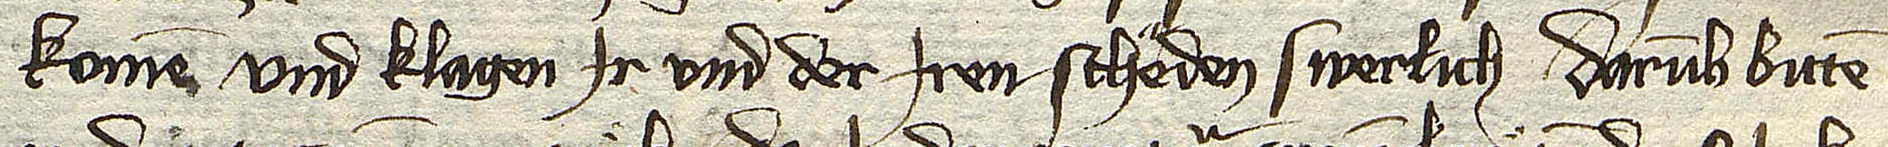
kome* vnd klagen Ir vnd der Iren ſcheden ſwerlich / Darub* bitte*
